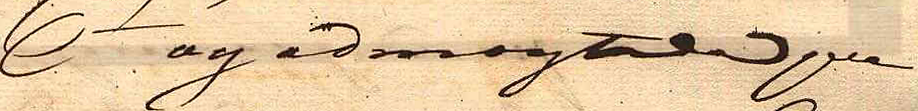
Foy admoestada que
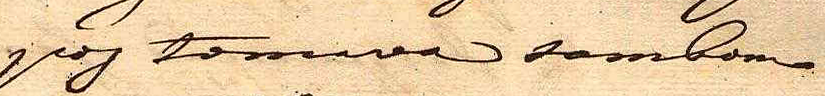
pos tomava tam bom
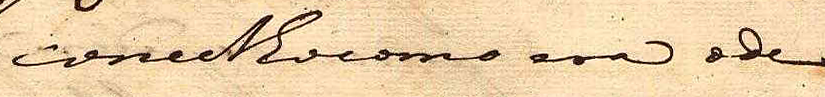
concelho como era o de
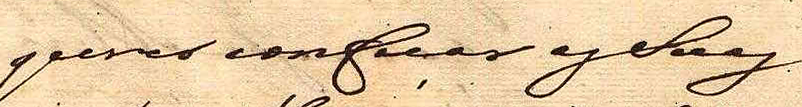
querer confeçar as Suas
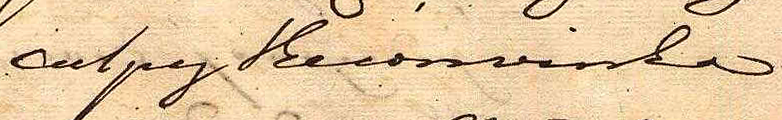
culpas lhe convinha
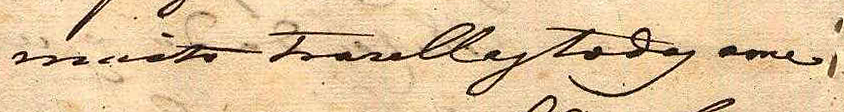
muito trazellas todas a me
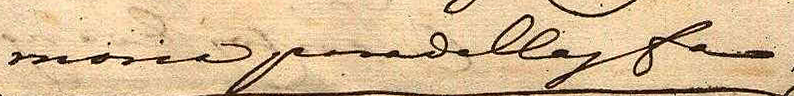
moria para dellas fa
